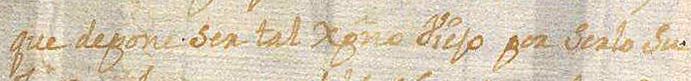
que depone ser tal Xpn̄o Viejo por Serlo Su
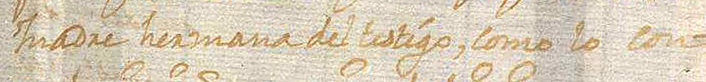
Madre hermana del testigo, como lo con
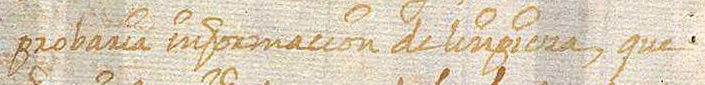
probaria informacion de linpieza, que
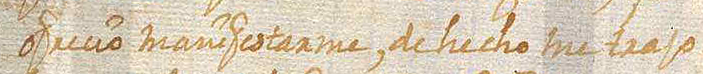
ofrecio manifestarme, de hecho me trajo
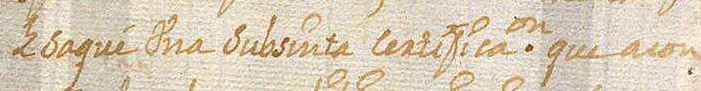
Y Saqué Vna Subsinta certefica.on que acon
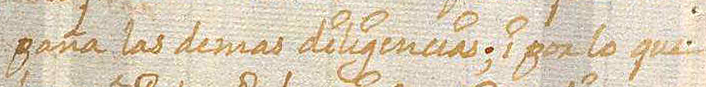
paña las demas diligencias; i por lo que
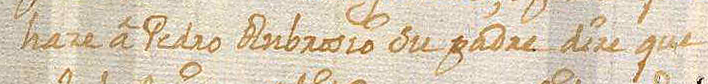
haze â Pedro Anbrosio Su padre dire que
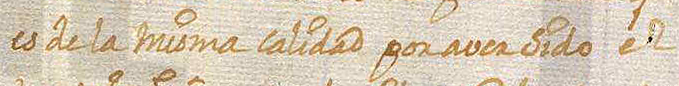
es de la misma calidad por aver Sido el
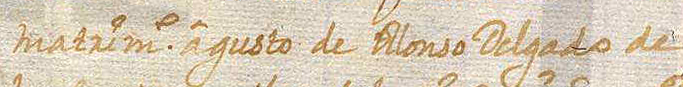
matrim.o â gusto de Alonso Delgado de
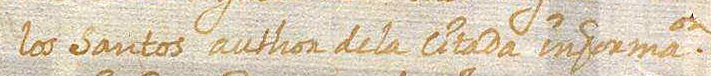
los Santos author de la citada informa.on
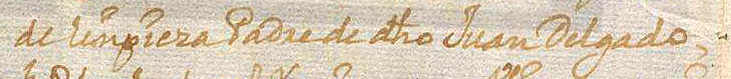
de linpieza Padre de d̄ho Iuan Delgado.
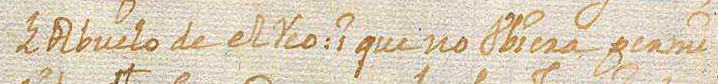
Y Abuelo de el Reo: i que no Vbiera permi
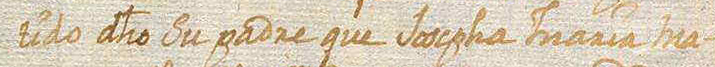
tido d̄ho Su padre que Iosepha Maria ma
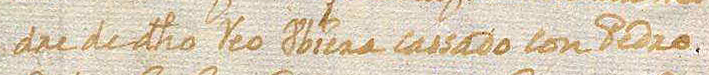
dre de d̄ho Reo Vbiera cassado con Pedro
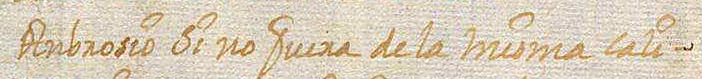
Anbrosio Si no fuera de la misma cali
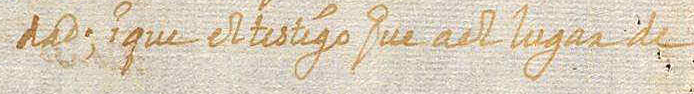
dad; e que el testigo fue a el lugar de
